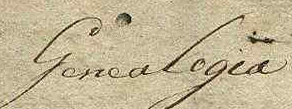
Genealogia
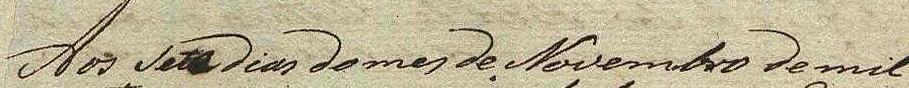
Aos sete dias do mes de Novembro de mil
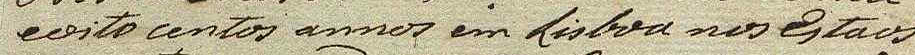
e oitocentos annos em Lisboa nos Estaos
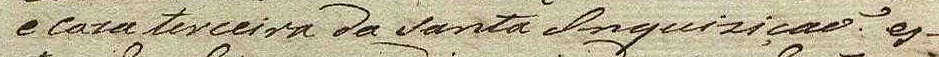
e caza terceira da santa Inquiziçaõ es
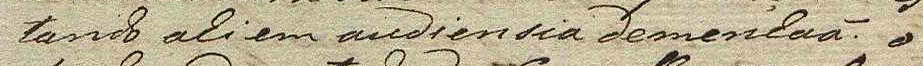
tando ahi em audiencia de menhaã o
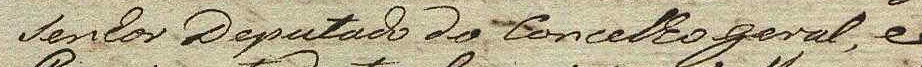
senhor Deputado do Concelho Geral, e
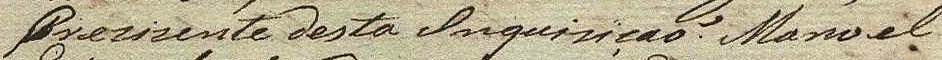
prezizente desta Inquiziçaõ Manoel
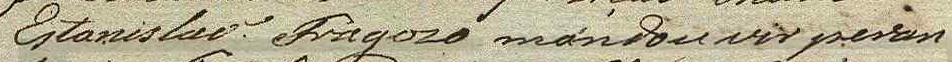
Estanislaõ Fragozo mandou vir peran
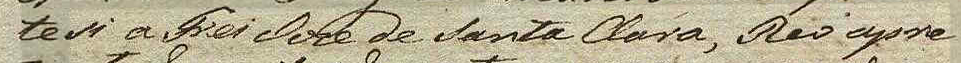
te si a Frei Ioze de Santa Clara, Reo apre
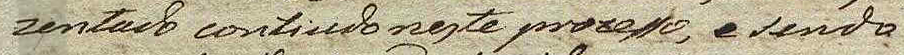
zentado conteudo neste processo, e sendo
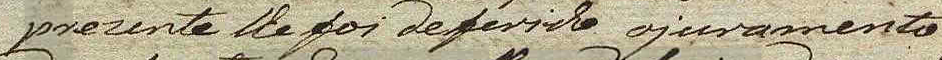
prezente lhe foi deferido o juramento
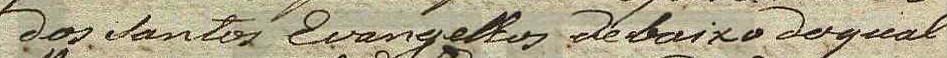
dos santos Evangelhos debaixo do qual
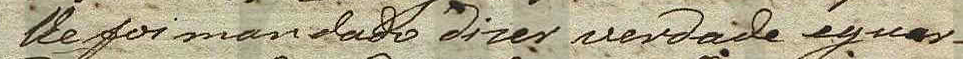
lhe foi mandado dizer verdade e guar
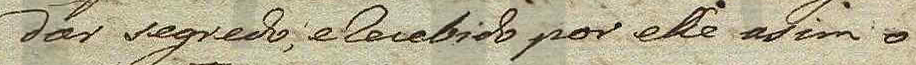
dar segredo, e Recebido por elle asim o
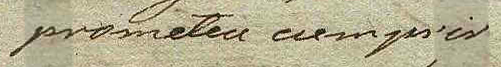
prometeu cumprir
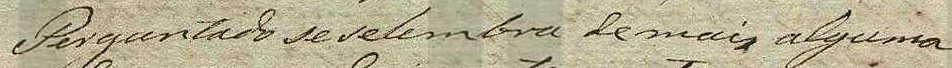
Perguntado se se lembra de mais alguma
